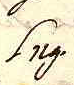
Lug.
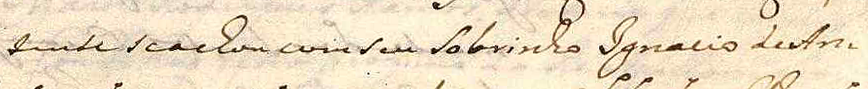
tente se achou com seu sobrinho Ignacio de An
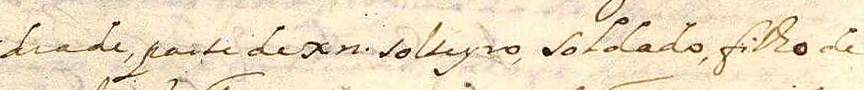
drade, parte de x n. solteyro, soldado, filho de
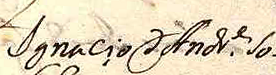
Ignaçio d̄Andr.e so
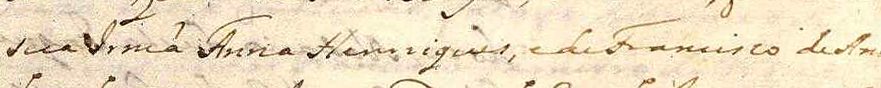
sua Irmã Anna Henrriques, e de Francisco de An
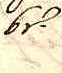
br.o
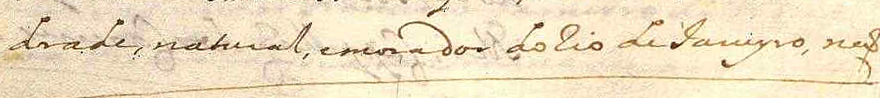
drade, natural, e morador do Rio de Ianeyro, naõ
